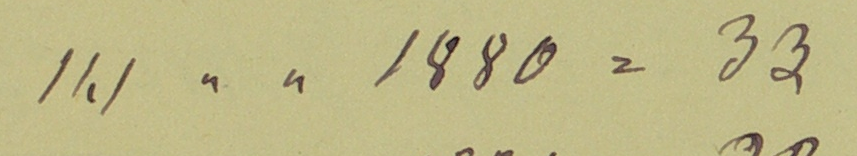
11) * 1880 = 33
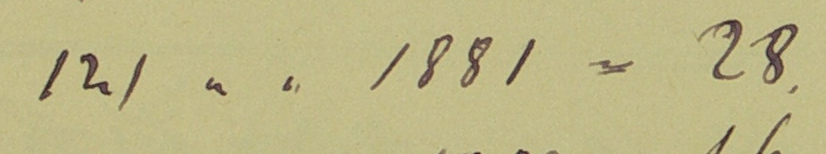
12) * 1881 = 28
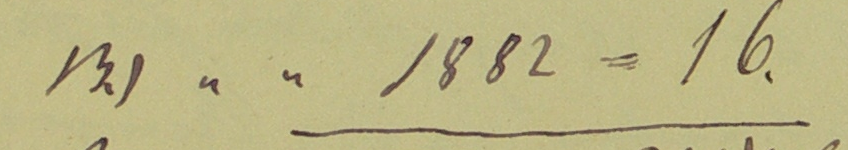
13) * 1882 = 16
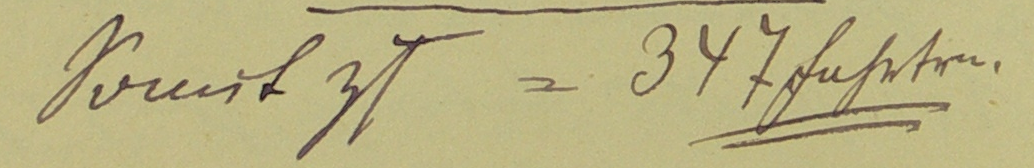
Somit zusammen = 347 Fahrten
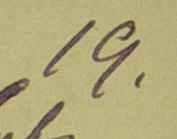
19
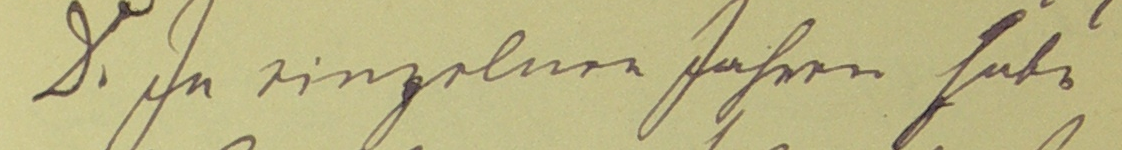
D.) In einzelnen Jahren habe
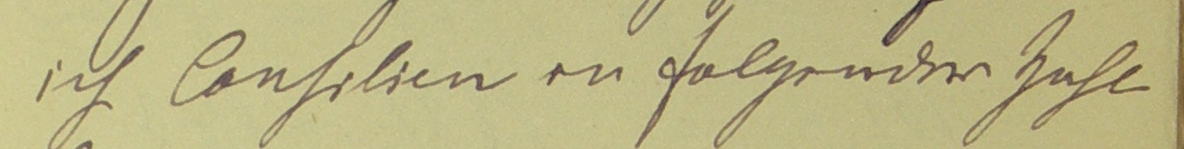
ich Consilien in folgender Zahl
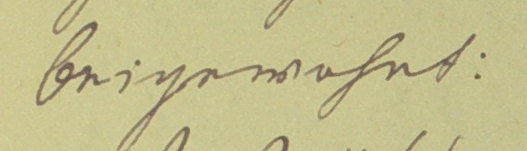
beigewohnt:
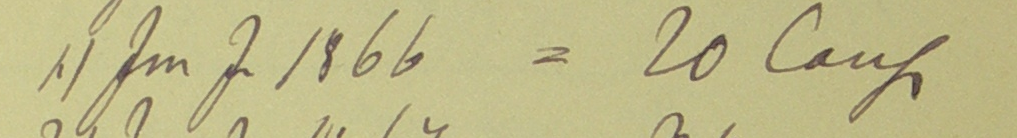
1) Im Jahr 1866 = 20 Consilien
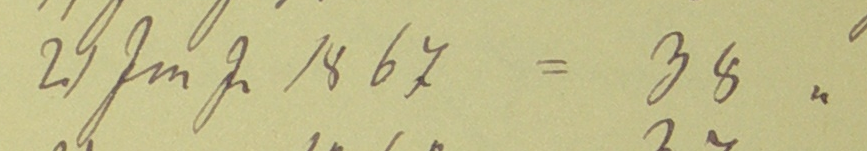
2) * 1867 = 38 *
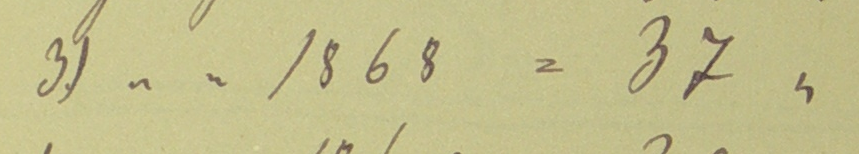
3) * 1868 = 37 *
